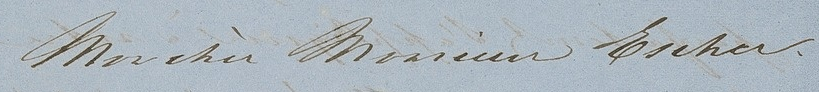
Mon chèr Monsieur Escher.
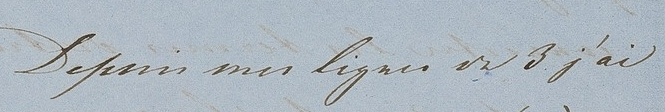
Depuis mes lignes du 3 j'ai
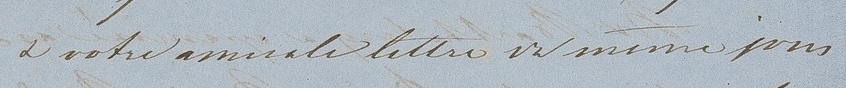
& votre amicale lettre du même jour
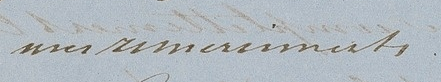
mes remerciments.
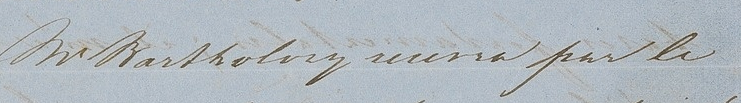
MrBartholony recevra par le
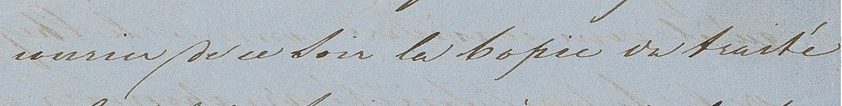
courier de ce soir la Copie du traité
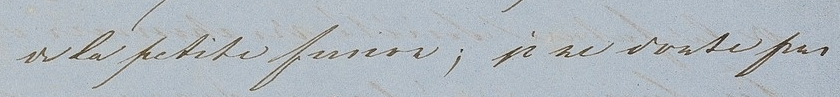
de la petite fusion; je ne doute pas
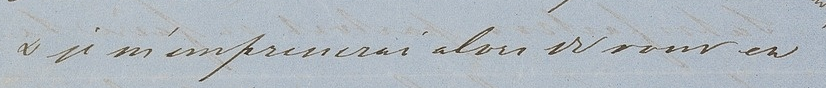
& je m'empresserai alors de vous en
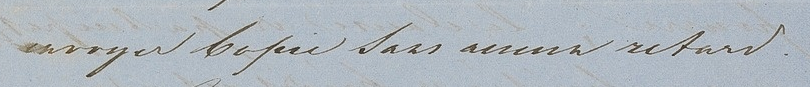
envoyer Copie sans aucun retard.
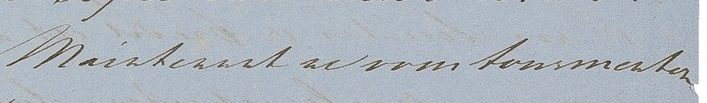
Maintenant ne vous tourmentez
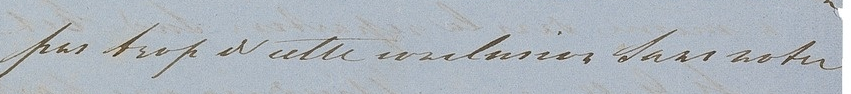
pas trop de cette conclusion sans votre
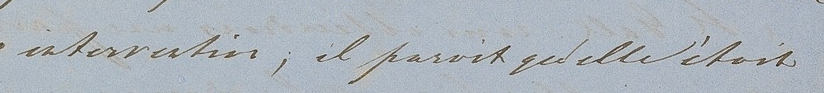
intervention; il parait qu'elle était
